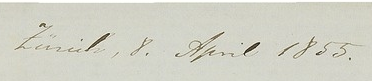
Zürich, 8. April 1855.
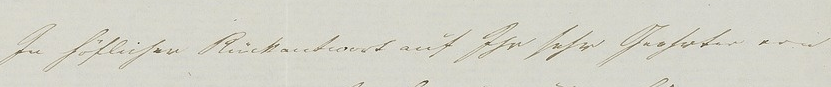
In höflicher Rückantwort auf Ihr sehr Geehrtes von
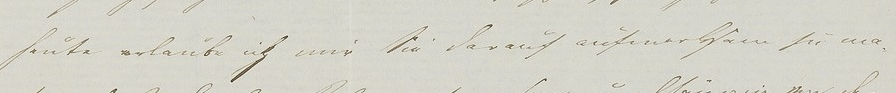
heute erlaube ich mir, Sie darauf aufmerksam zu ma-
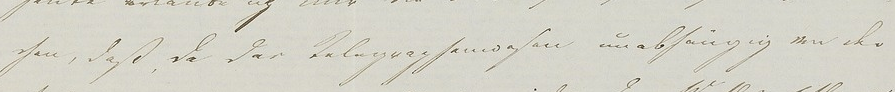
chen, daß, da das Telegraphenwesen unabhängig von der
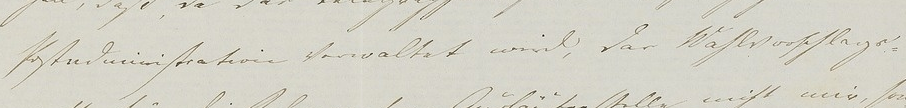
Postadministration verwaltet wird, das Wahlvorschlags-
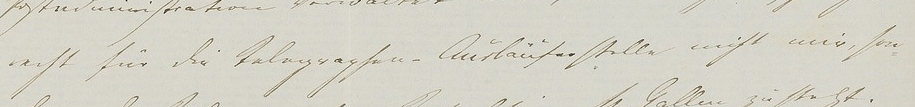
recht für die Telegraphen-Ausläuferstelle nicht mir, son-
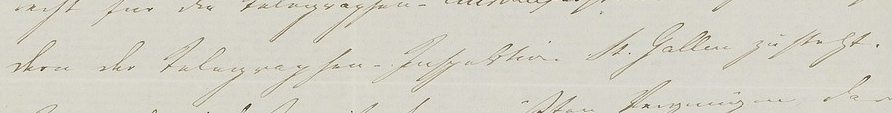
dern der Telegraphen-Inspektion St. Gallen zusteht.
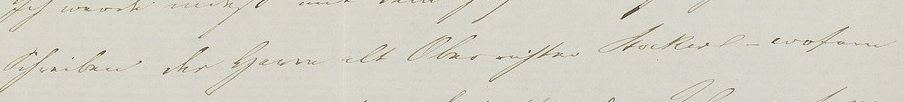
Schreiben des Herrn alt Oberrichter Stocker – wofern
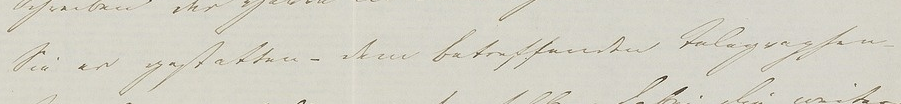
Sie es gestatten – dem betreffenden Telegraphen-
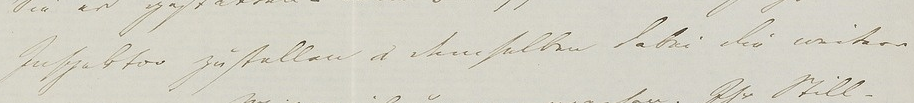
Inspektor zustellen & demselben dabei die weitern
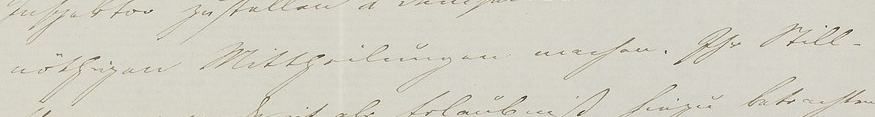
nöthigen Mittheilungen machen. Ihr Still-
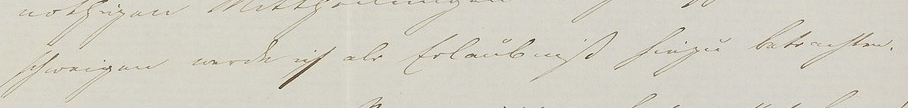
schweigen werde ich als Erlaubniß hiezu betrachten.
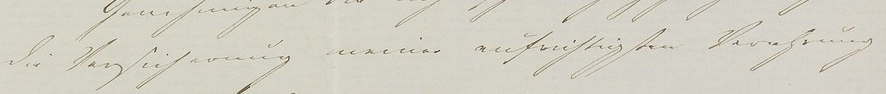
die Versicherung meiner aufrichtigen Verehrung
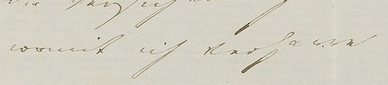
womit ich verharre
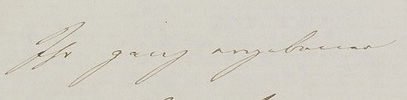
Ihr ganz ergebener
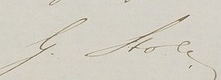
G. Stoll.
